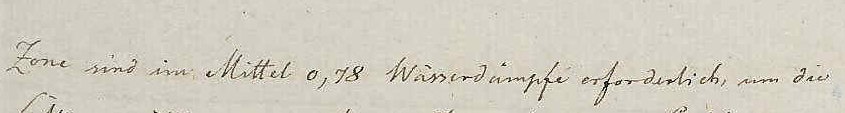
Zone sind im Mittel 0,78 Wässerdämpfe erforderlich, um die
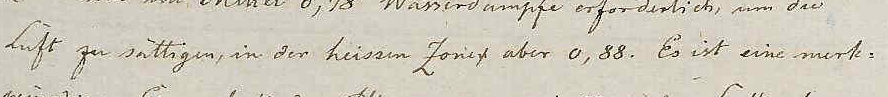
Luft zu sättigen, in der heissen Zonen aber 0,88. Es ist eine merk-
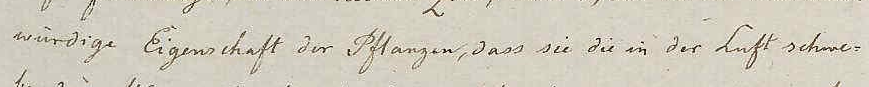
würdige Eigenschaft der Pflanzen, dass sie die in der Luft schwe-
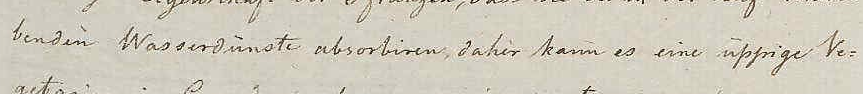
benden Wasserdünste absorbiren, daher kann es eine üppige Ve-
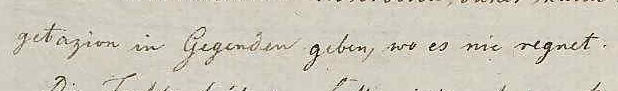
getazion in Gegenden geben, wo es nie regnet.
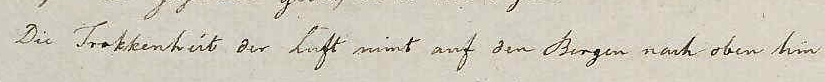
Die Trokkenheit der Luft nimt auf den Bergen nach oben hin
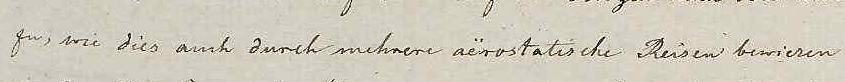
zu, wie dies auch durch mehrere aërostatische Reisen bewiesen
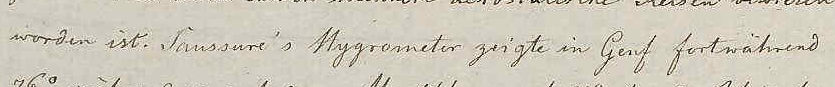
worden ist. Saussure's Hygrometer zeigte in Genf fortwährend
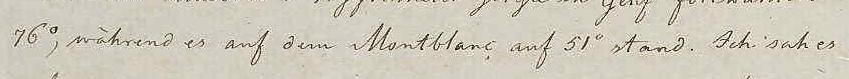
76°, während es auf dem Montblanc auf 51° stand. Ich sah es
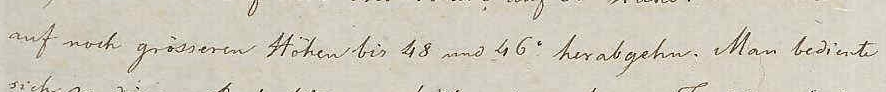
auf noch grösseren Höhen bis 48 und 46° herabgehn. Man bediente
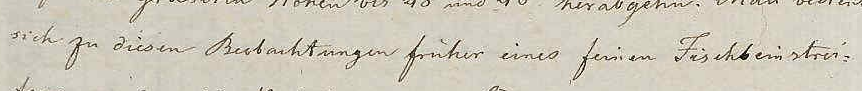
sich zu diesen Beobachtungen früher eines feinen Fischbeinstrei-
